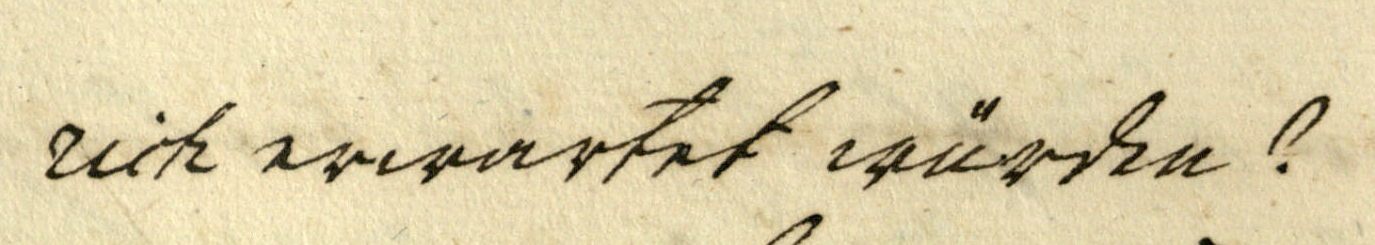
rich erwartet würden?
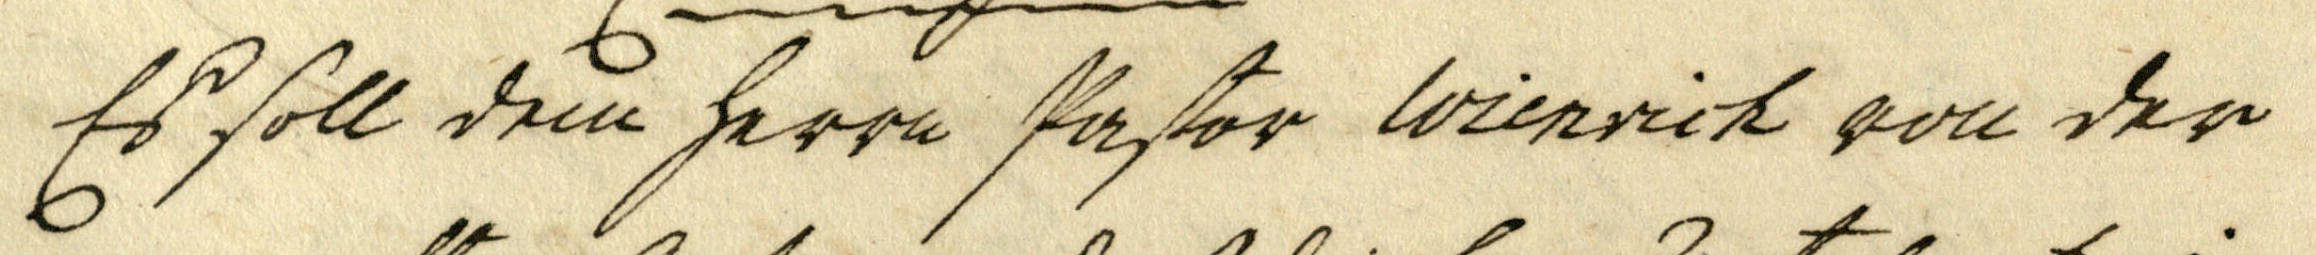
Es soll dem Herrn Pastor Wienrich von der
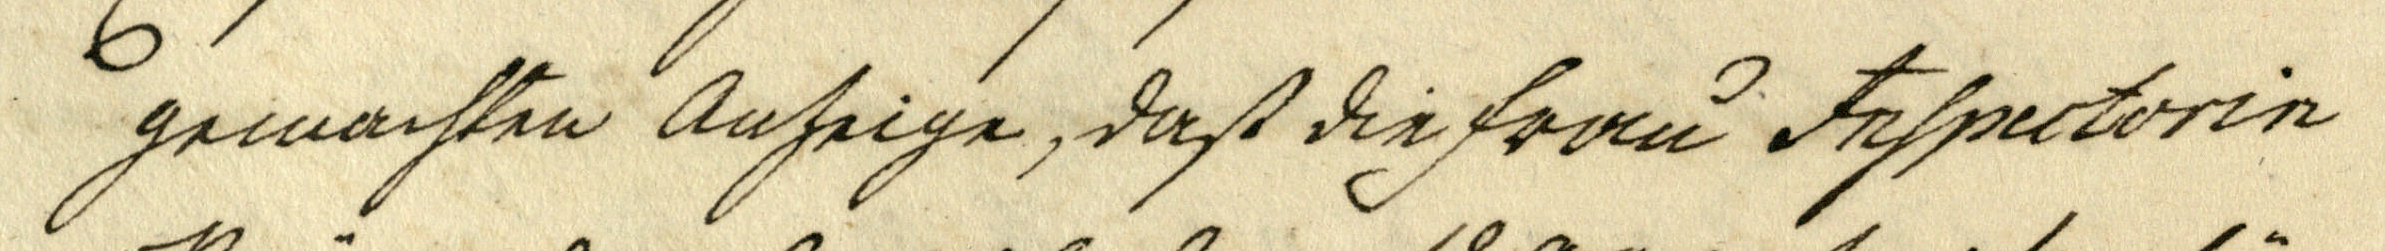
gemachten Anzeige, daß die Frau Inspectorin
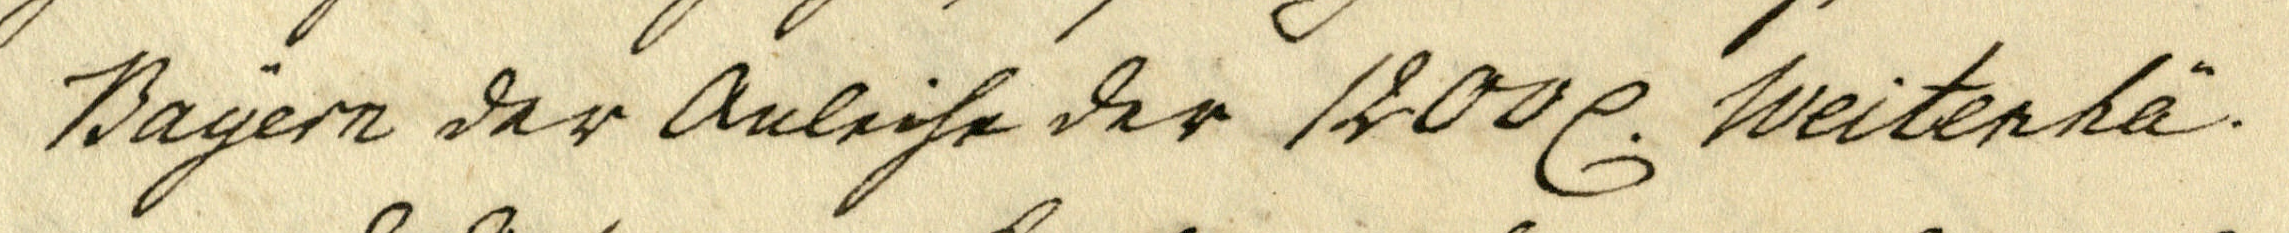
Baÿerm der Anleihe der 1200 l. Weitenhä¬
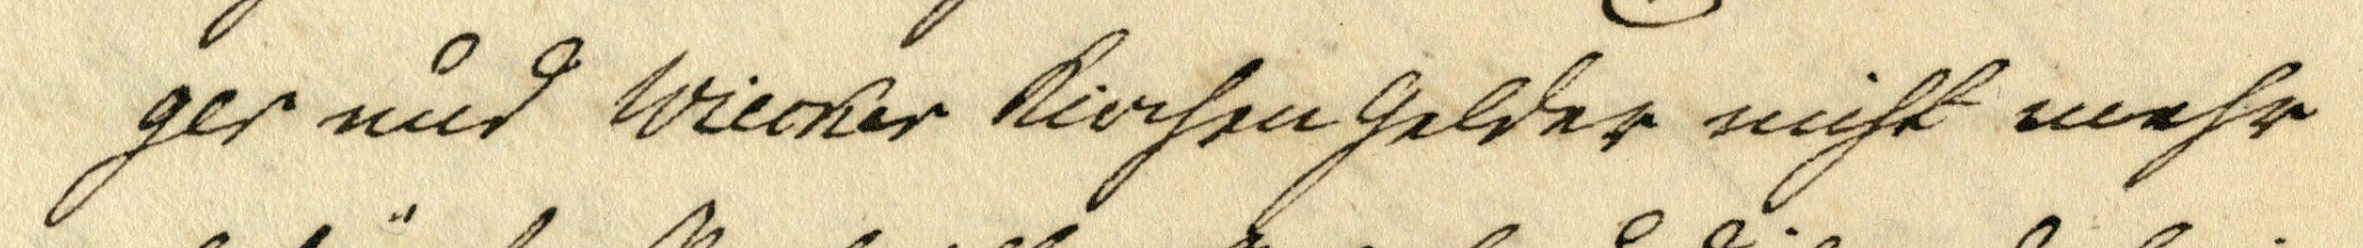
ger und Wiecker Kirchen Gelder nicht mehr
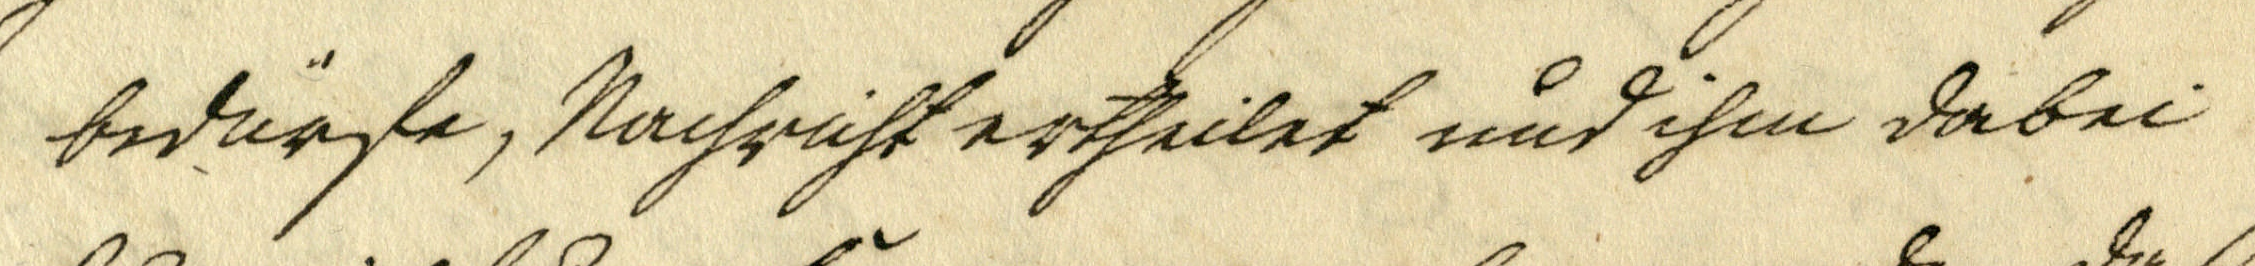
bedürfe, Nachricht ertheilet und ihm dabei
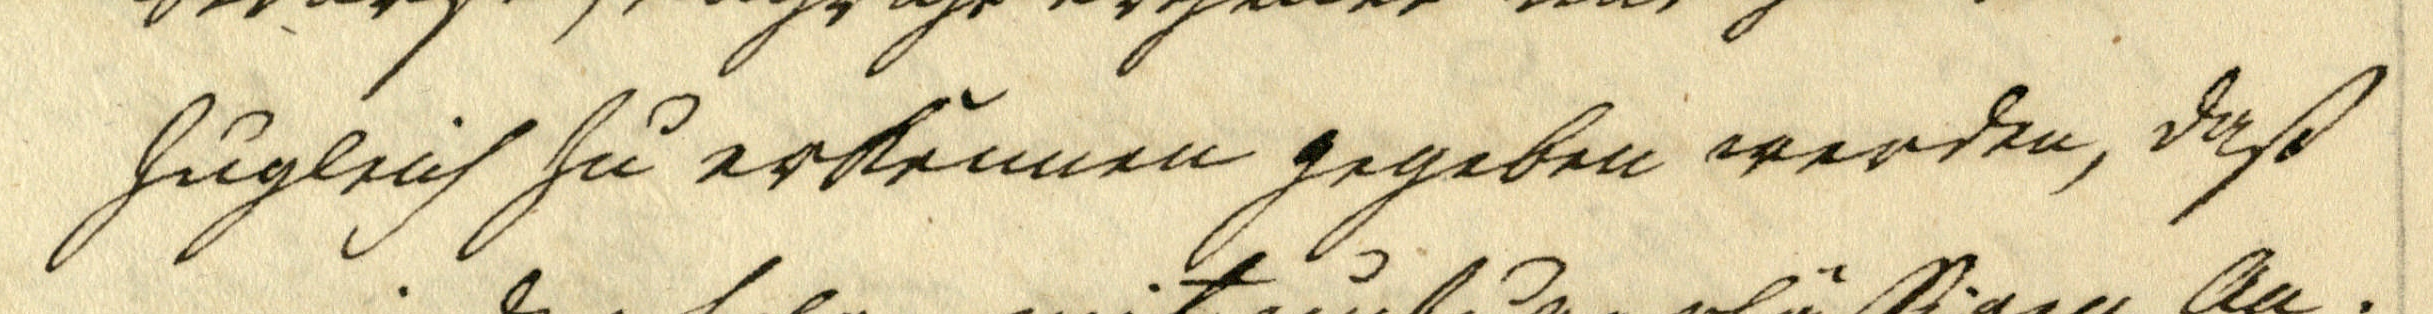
zugleich zu erkennen gegeben werden, daß
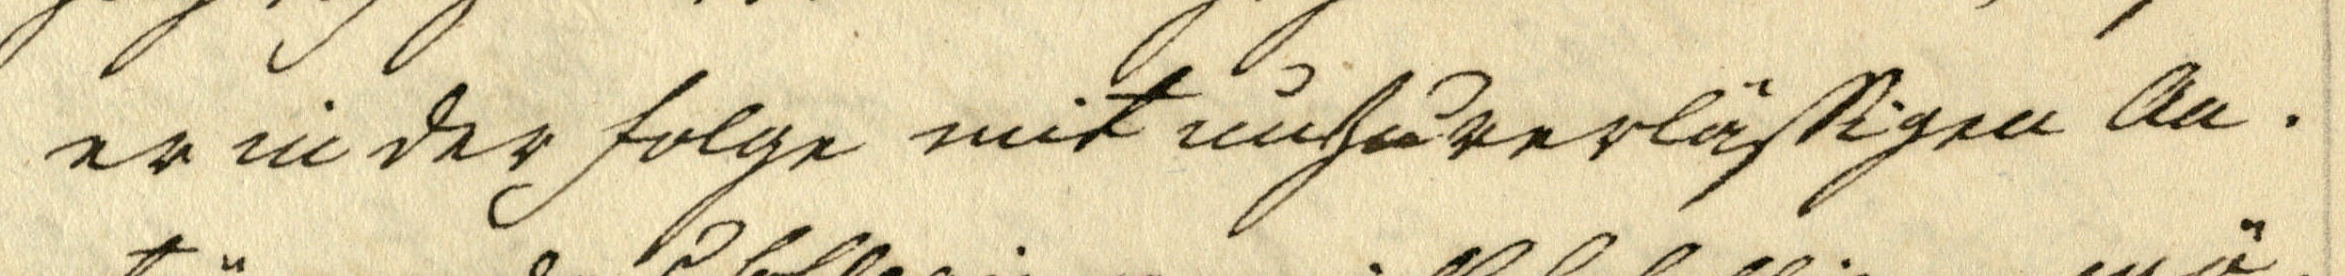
er in der Folge mit unmzuverlässigen An¬
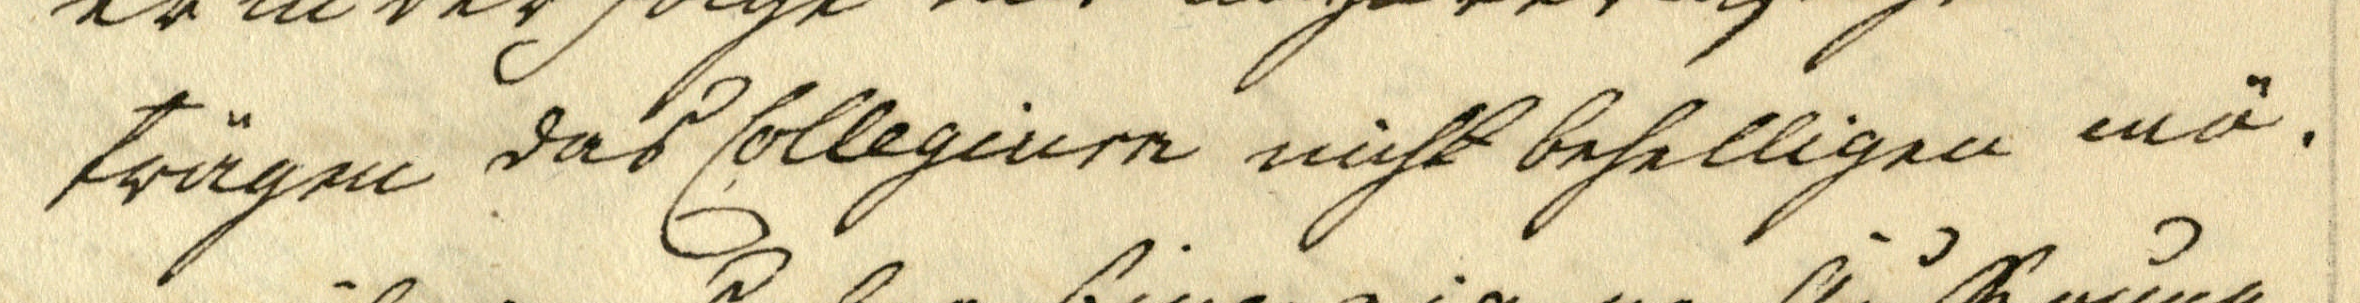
trägen das Collegium nicht behelligen mö¬
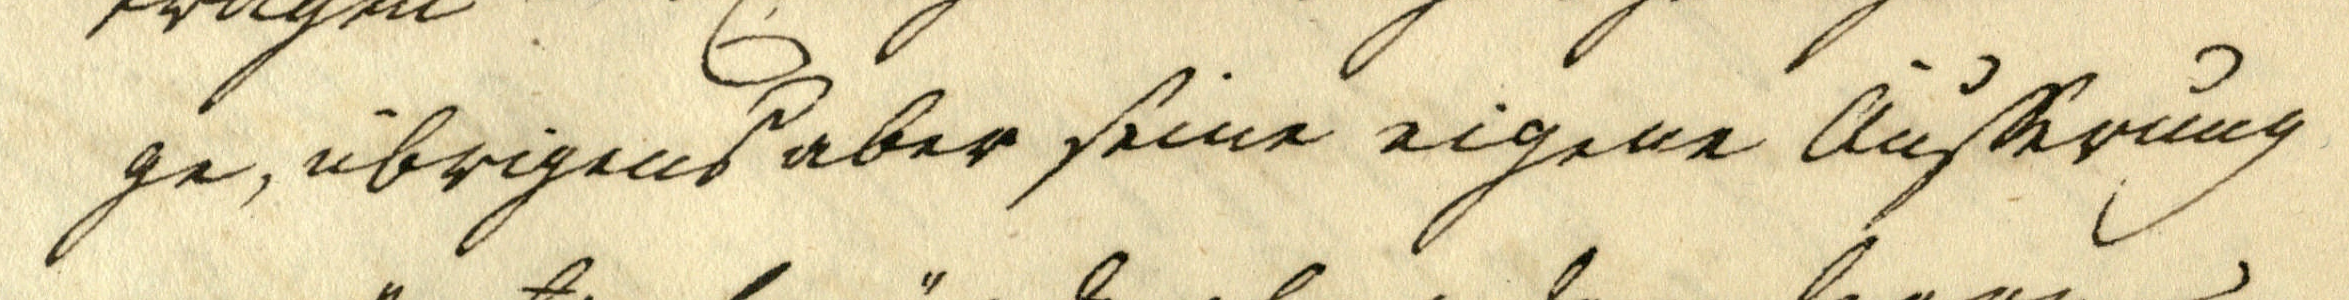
ge, übrigens aber seine eigene Äusserung
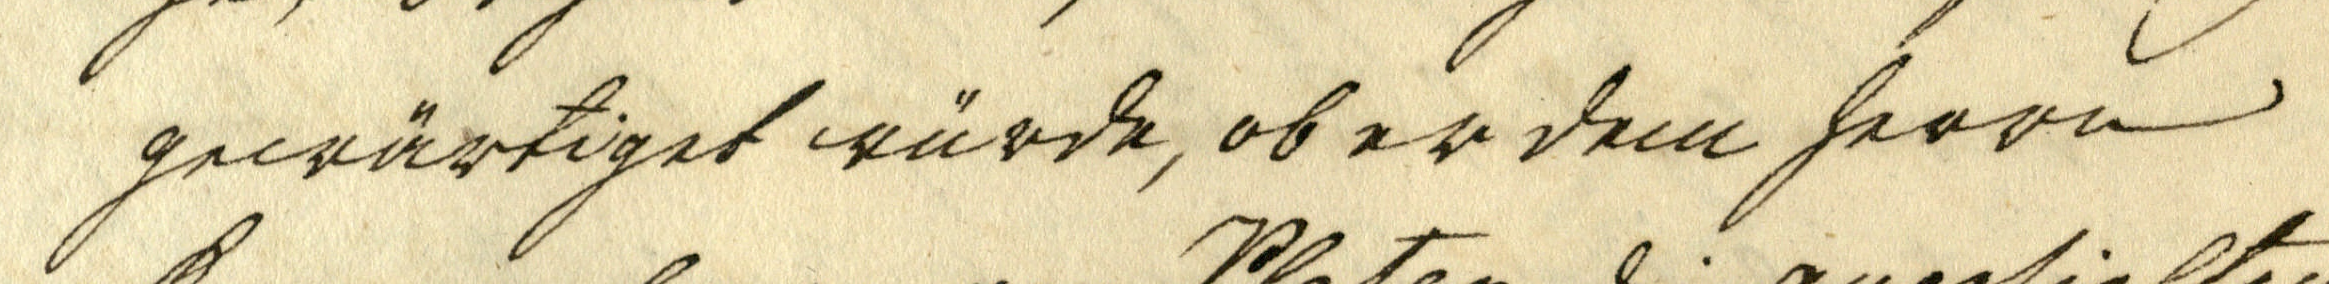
gewärtiget würde, ob er dem Herrn
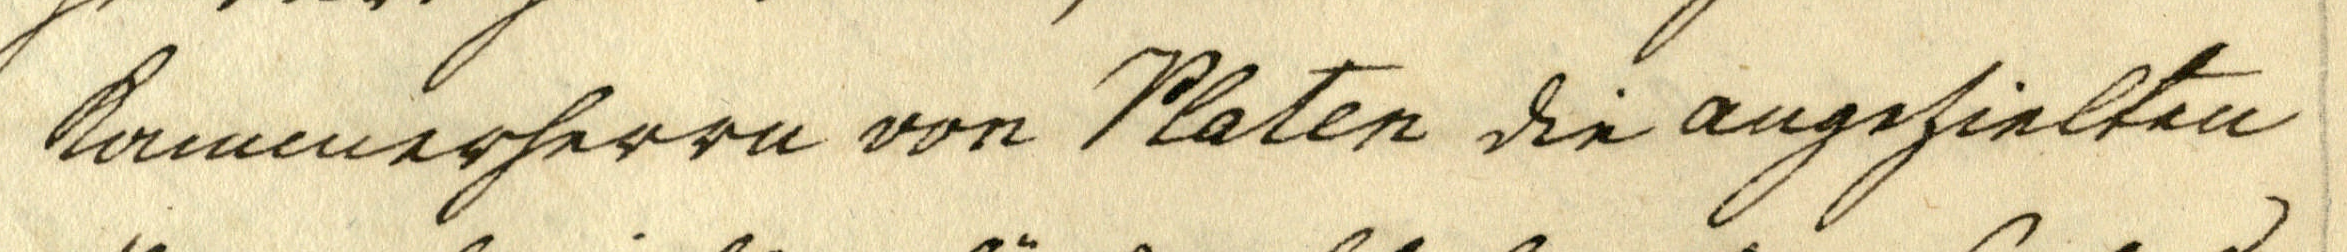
Kammerherrn von Platen die angezielten
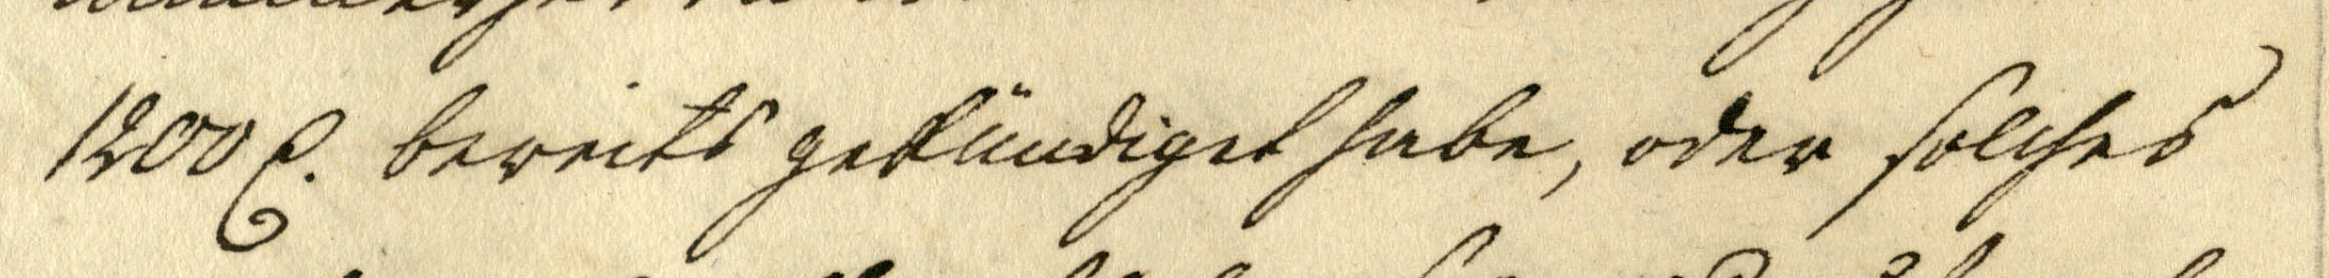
1200 l. bereits gekündiget habe, oder solches
